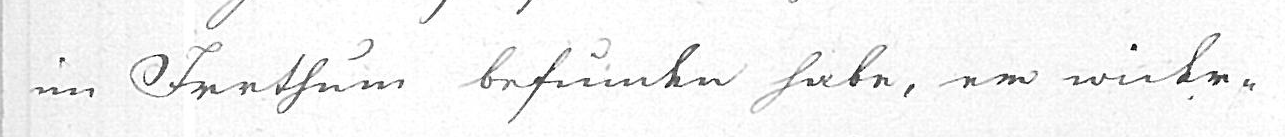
im Irrthum befunden habe, er wider-
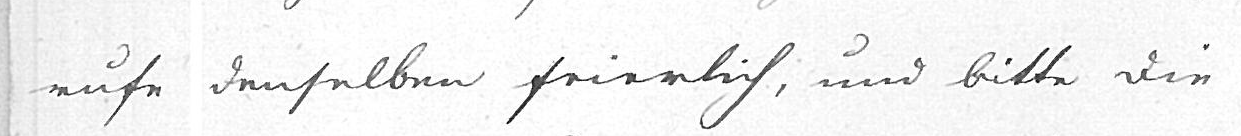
rufe denselben feierlich, und bitte die
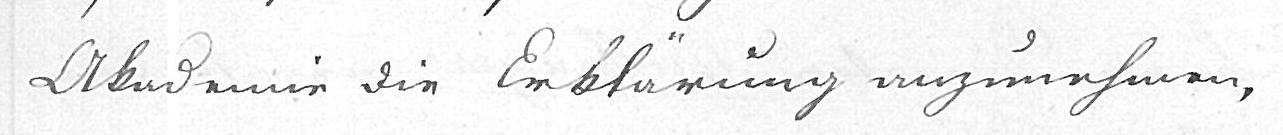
Akademie die Erklärung anzunehmen,
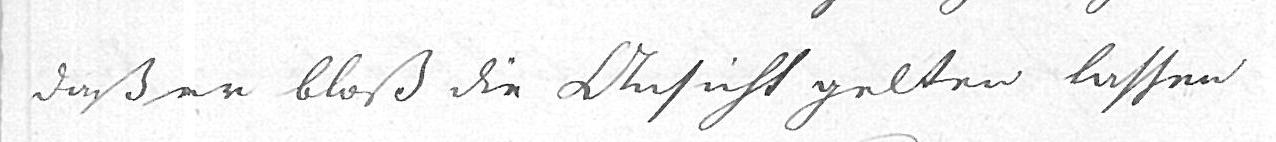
daß er bloß die Ansicht gelten lassen
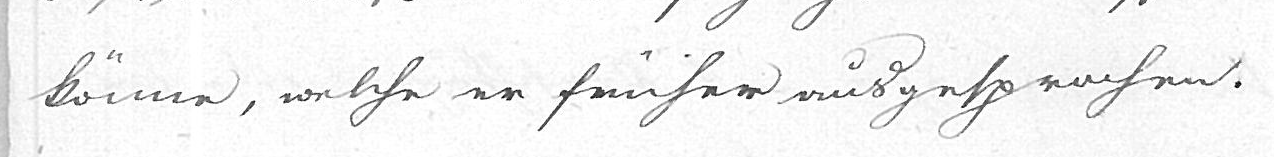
könne, welche er früher ausgesprochen.
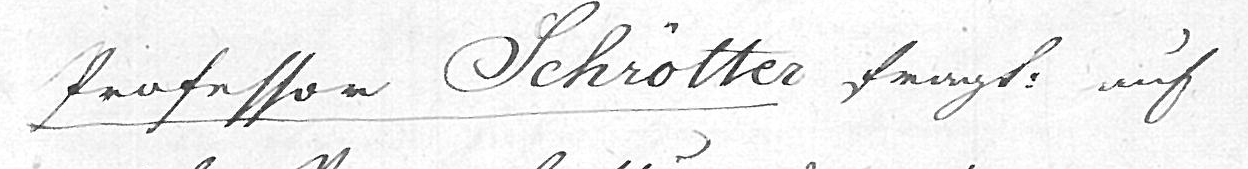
Professor Schrötter fragt, auf
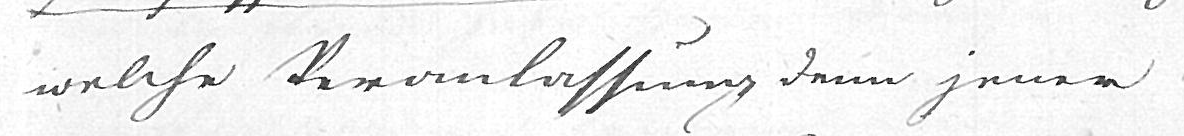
welche Veranlassung denn jener
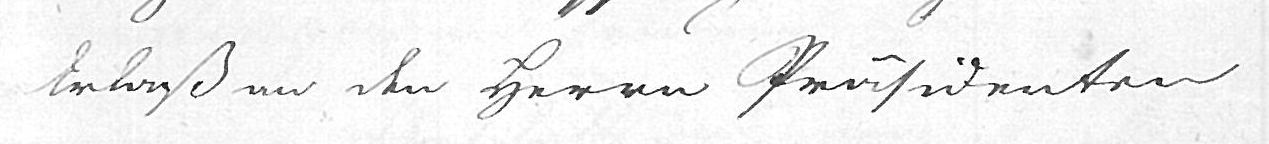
Erlaß an den Herrn Präsidenten
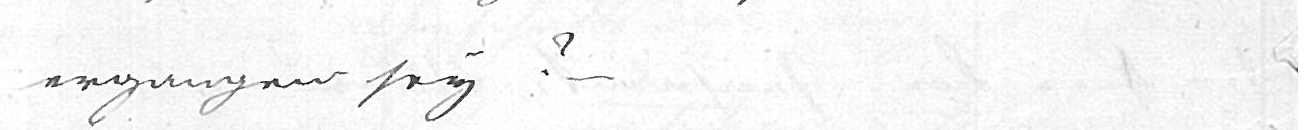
ergangen sey?
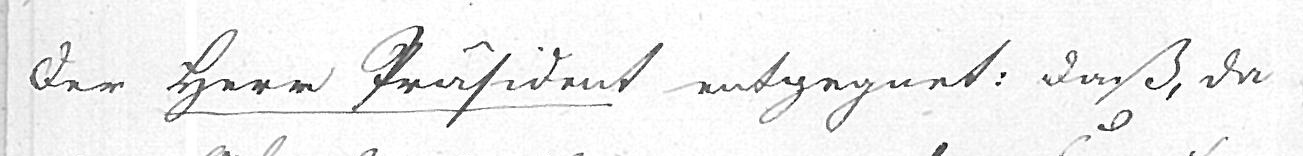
Der Herr Präsident entgegnet: daß, da
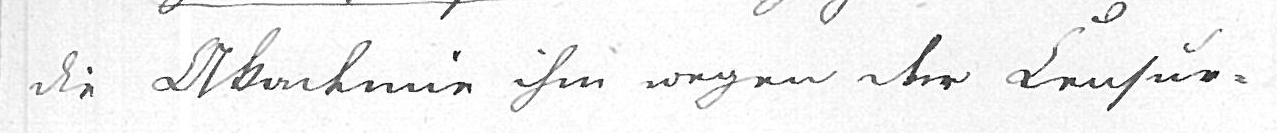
die Akademie ihm wegen der Censur-
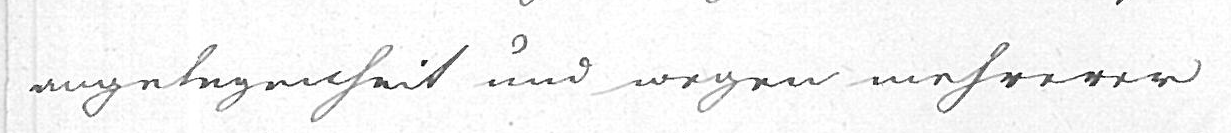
angelegenheit und wegen mehrerer
